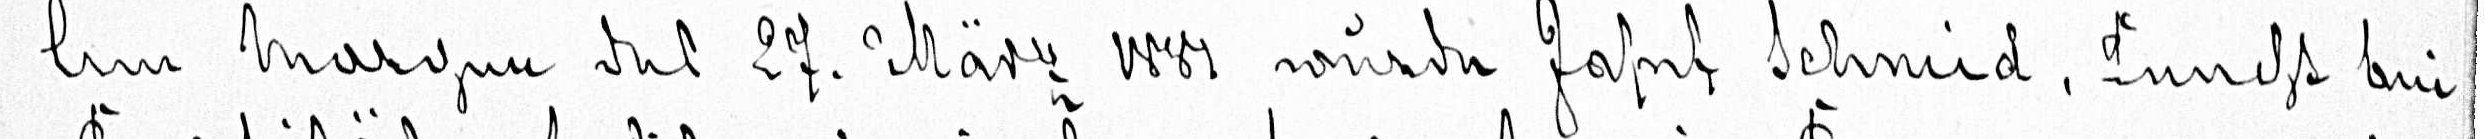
Am Morgen des 27. März 1881 wurde Josef Schmid, Knecht bei
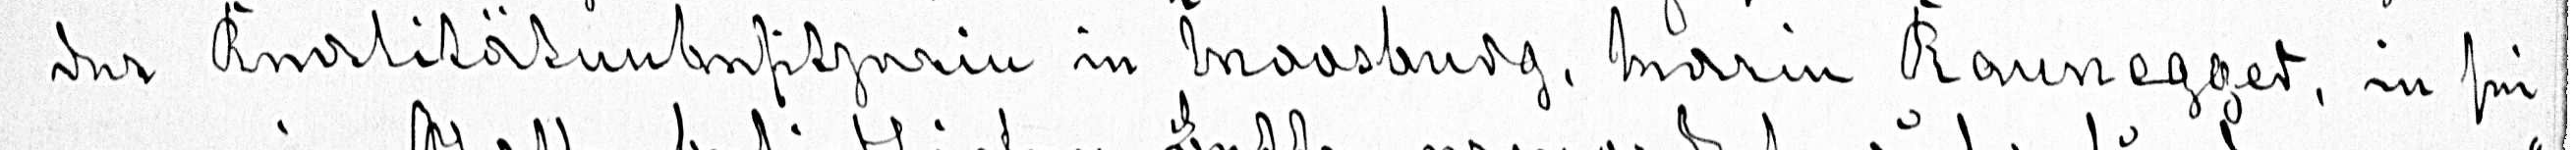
der Realitätenbesitzerin in Moosburg, Marie Raunegger, in sei¬
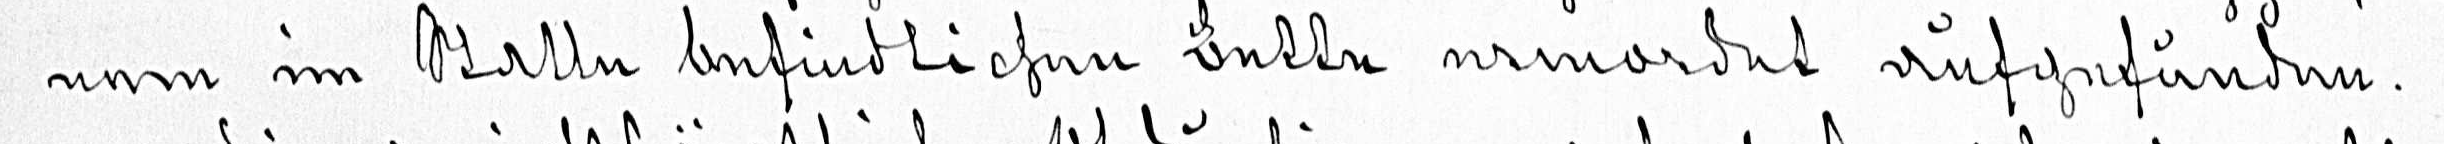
nem im Stalle befindlichen Bette ermordet aufgefunden.
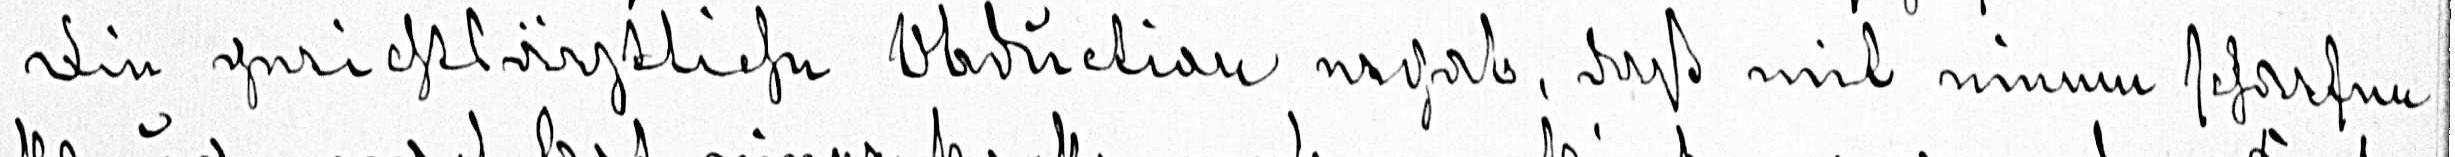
Die gerichtsärztliche Obduction ergab, daß mit einem scharfen
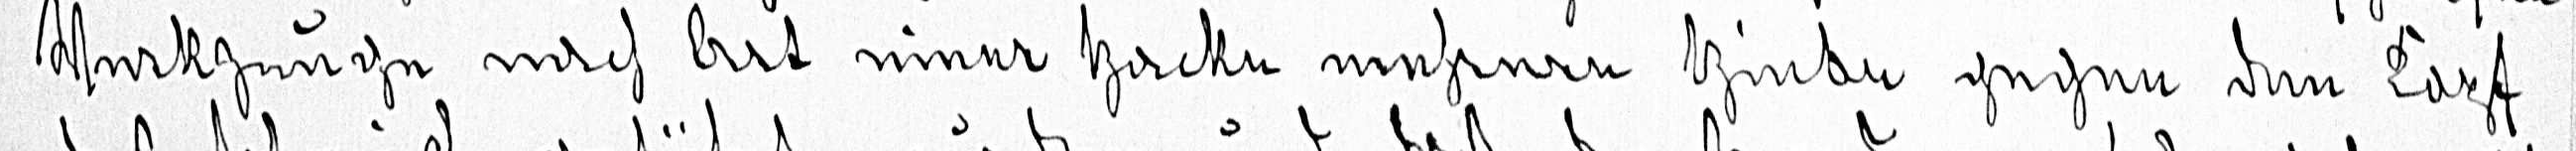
Werkzeuge nach Art einer Hacke mehrere Hiebe gegen den Kopf
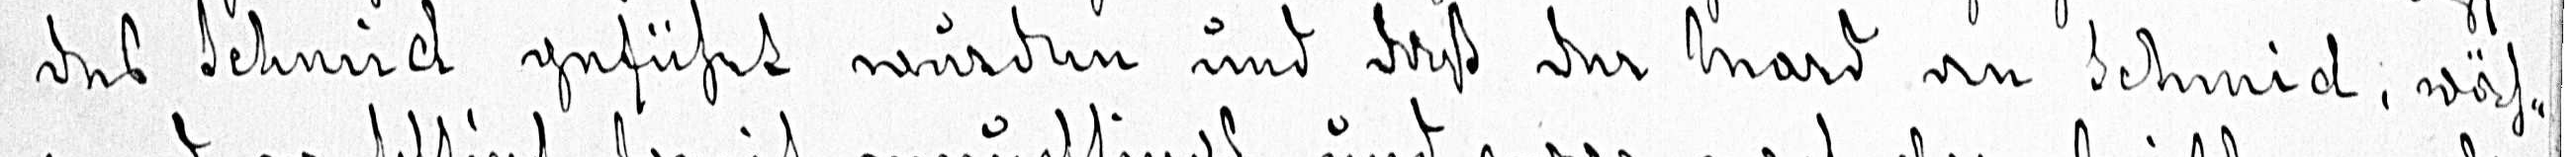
des Schmid geführt wurden und daß der Mord an Schmid, wäh¬
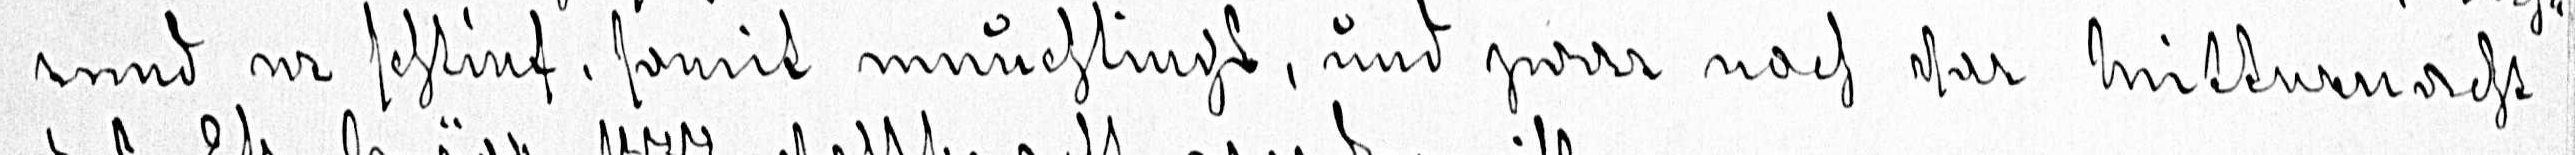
rend er schlief, somit meuchlings, und zwar noch vor Mitternacht
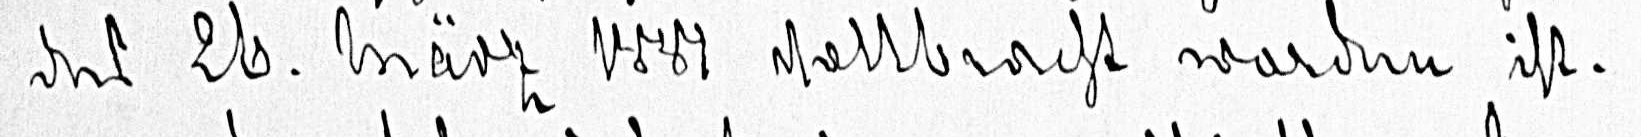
des 26. März 1881 vollbracht worden ist.
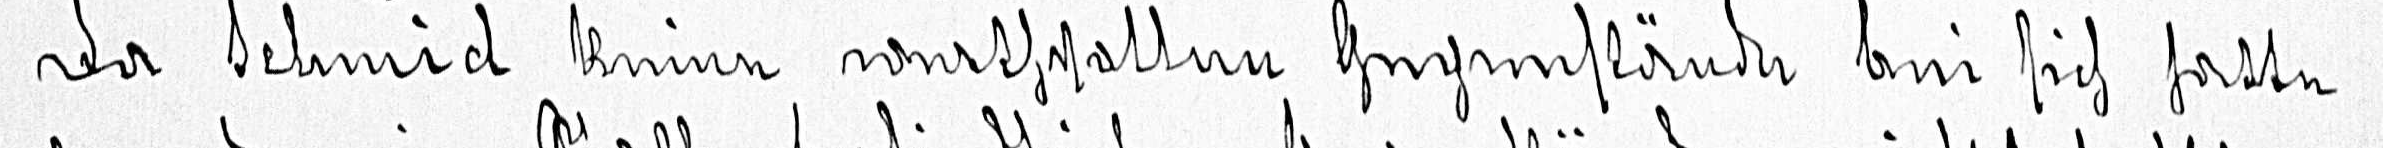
Da Schmid keine werthvollen Gegenstände bei sich hatte
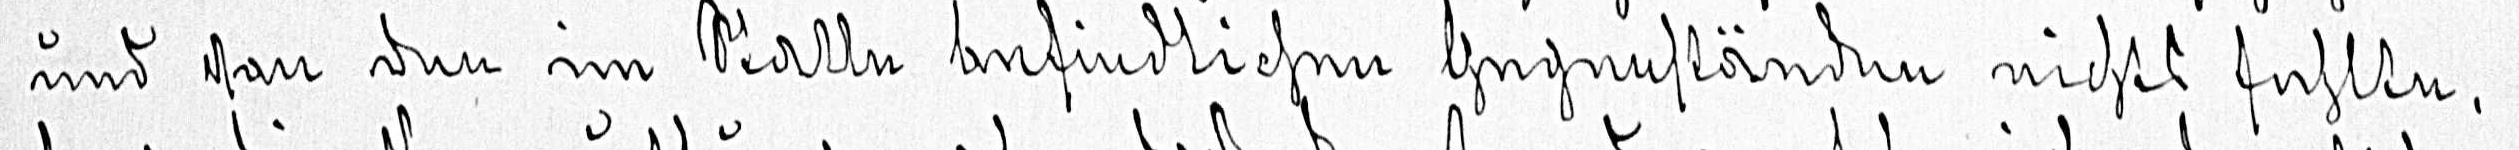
und von den im Stalle befindlichen Gegenständen nichts fehlte,
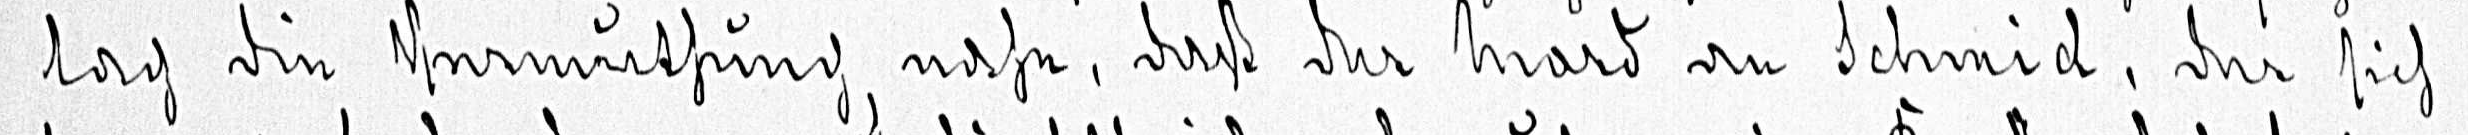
lag die Vermuthung nahe, daß der Mord an Schmid, der sich
